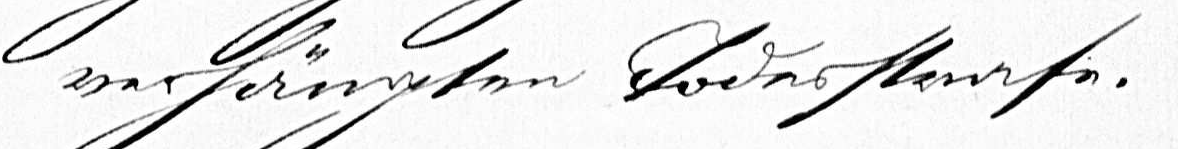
verhängten Todesstrafe.
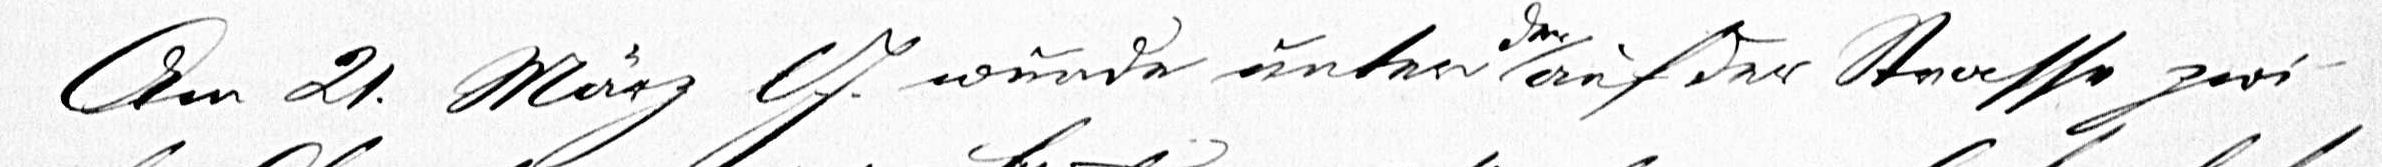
Am 21. März J. wurde unter der auf der Strasse zwi¬
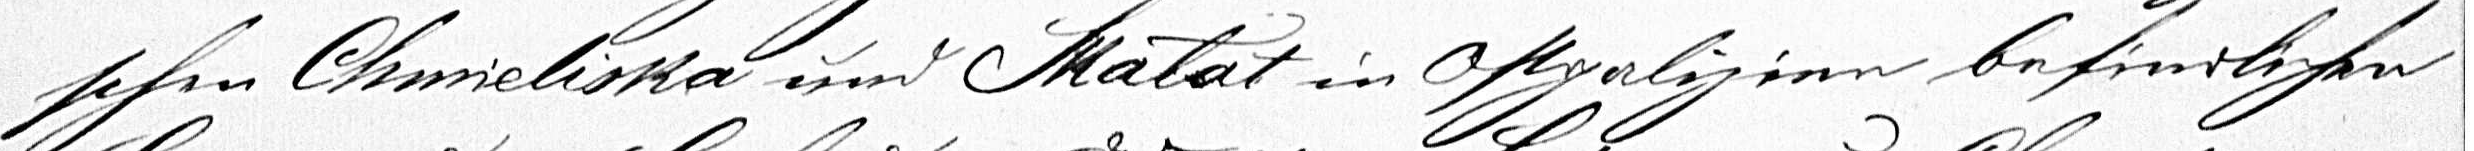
schen Chmieliska und Skatat in Ostgalizien befindlichen
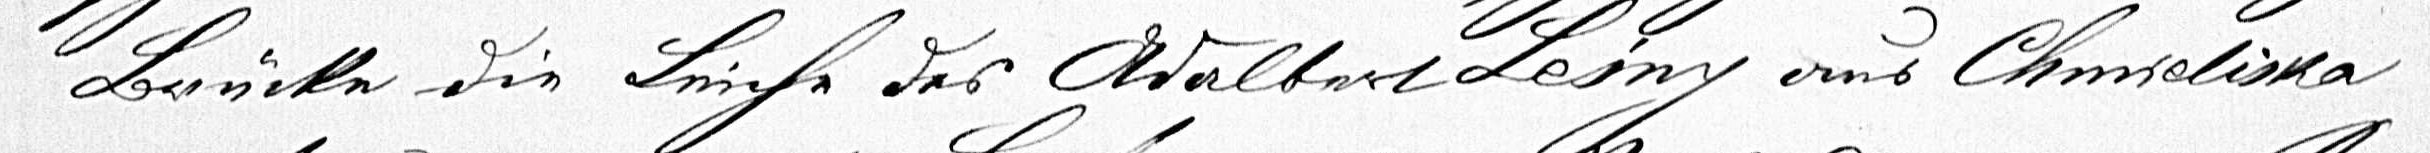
Brücke die Leiche des Adalbert Leśny aus Chmieliska
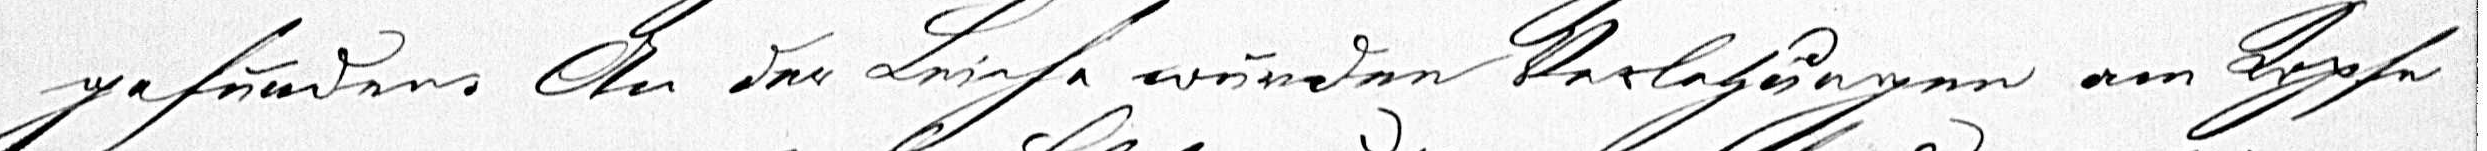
gefunden. An der Leiche wurden Verletzungen am Kopfe
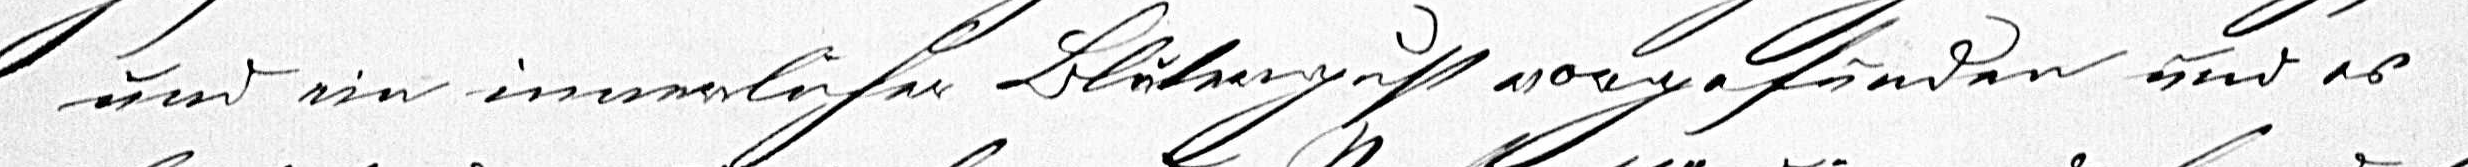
und ein innerlicher Bluterguß vorgesunden und es
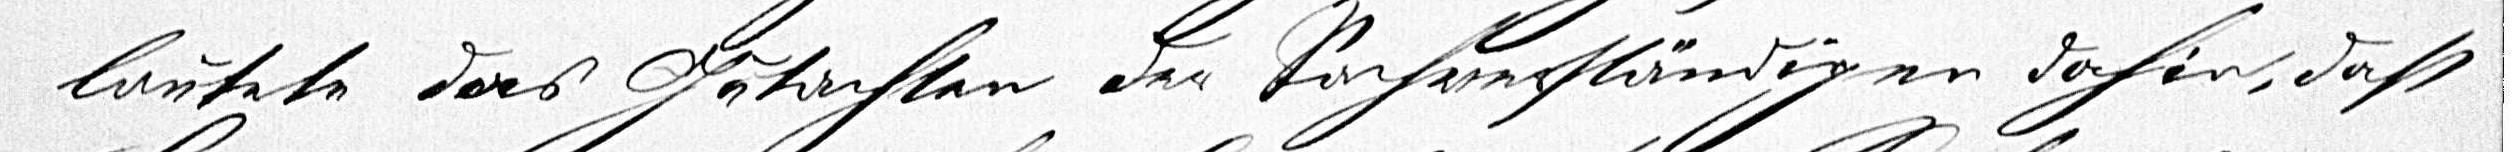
lautete das Gutachten der Sachenständigen dahin, daß
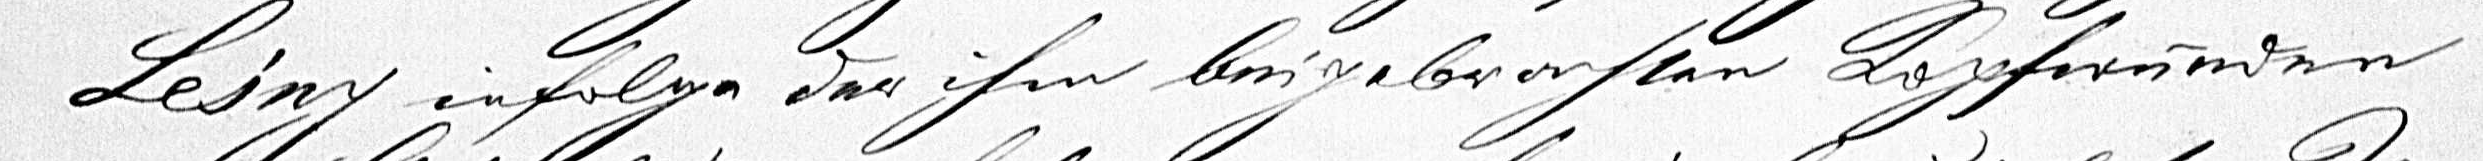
Leśny infolge der ihm beigebrachten Kopfwunden
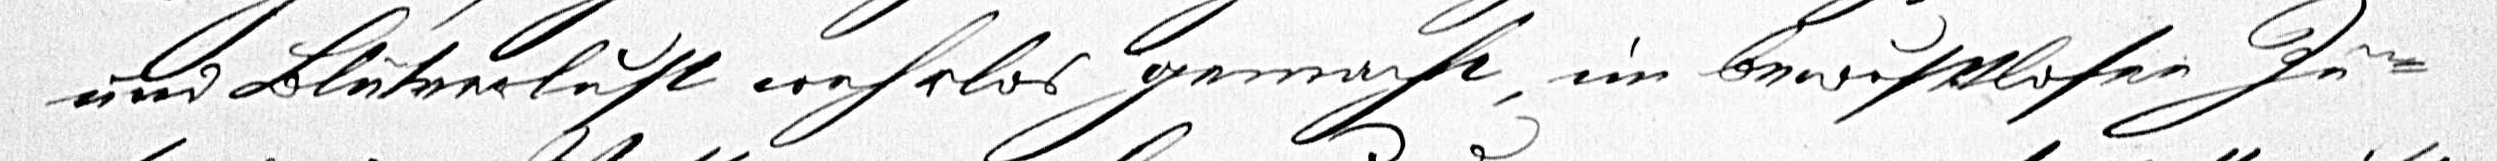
und Blutverlust wehrlos gemacht, im bewußtlosen Zu¬
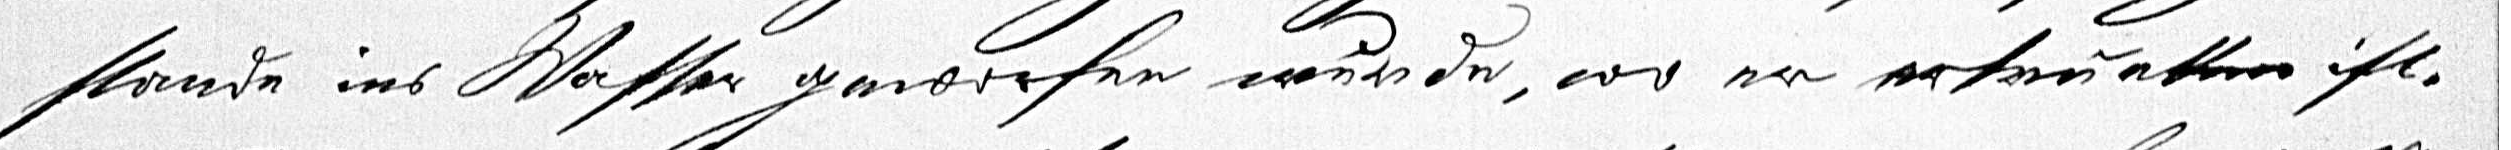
stande ins Wasser geworfen wurde, wo er ertrunken ist.
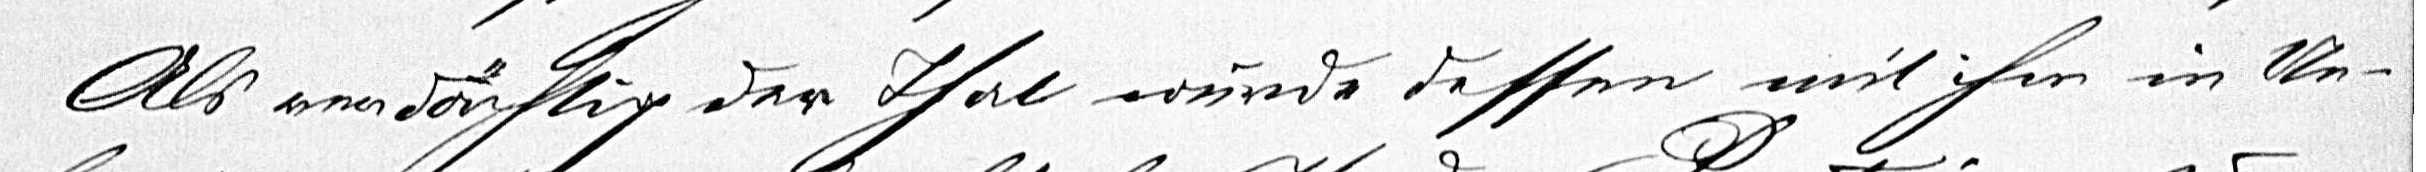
Als verdächtig der That wurde dessen mit ihm in Un¬
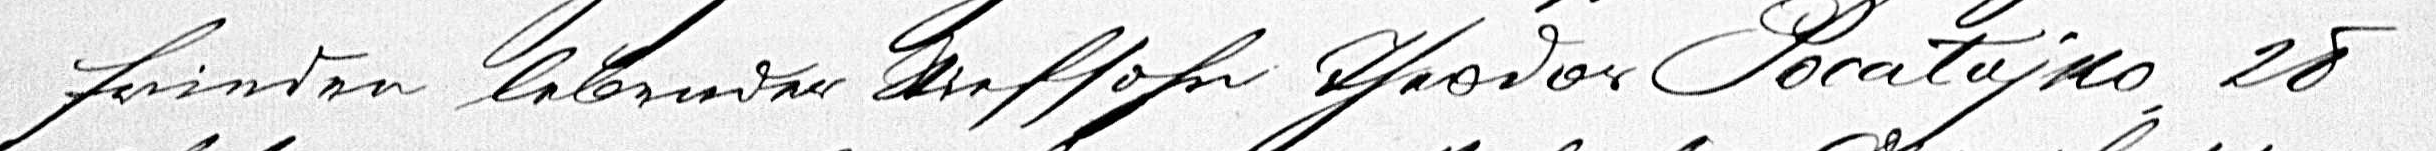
frieden lebender Stiefsohn Theodor Pocatujko, 28
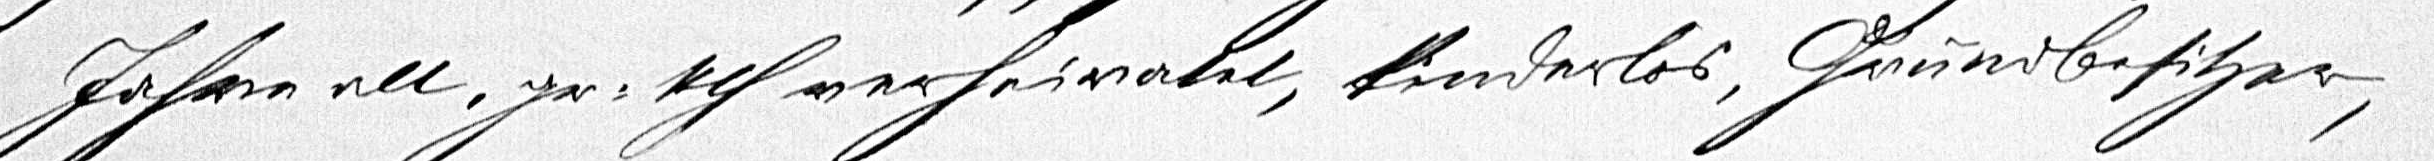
Jahre alt, gr. kth verheiratet, kinderlos, Grundbesitzer,
